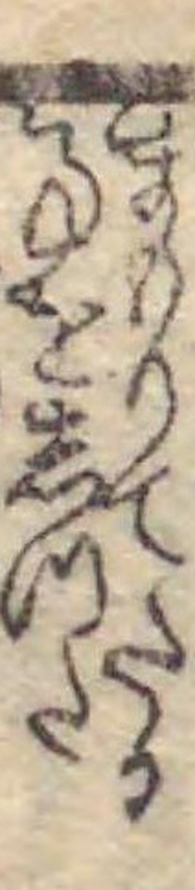事をしつた
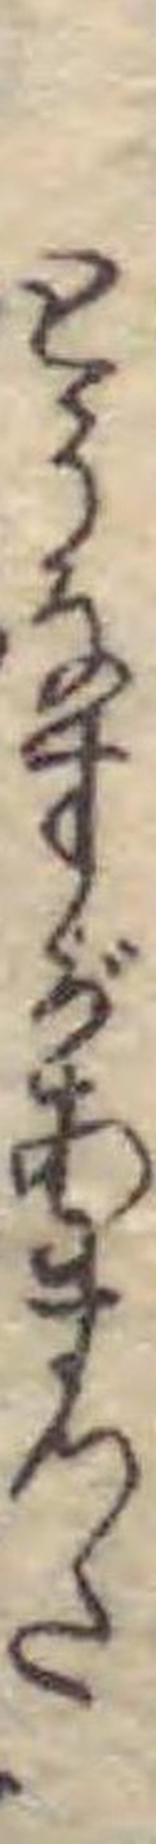とうなすがあまつた
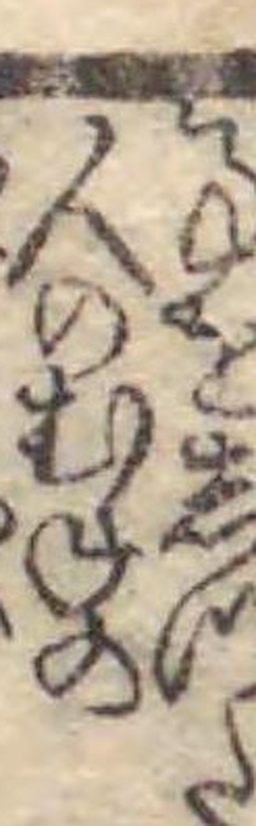人のむねの
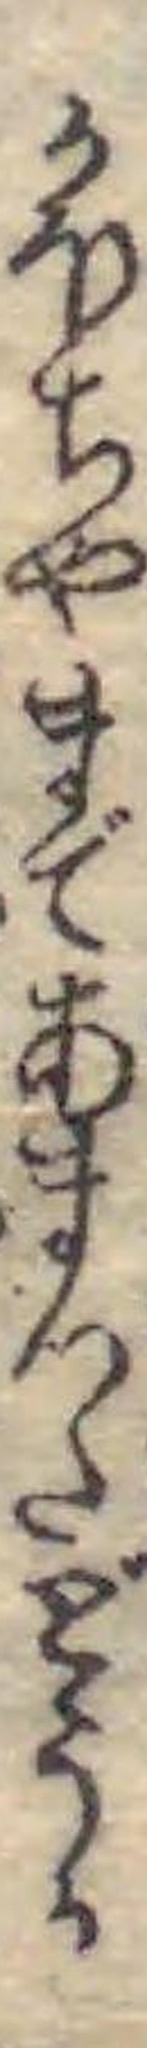かほちやまであまつたどうか
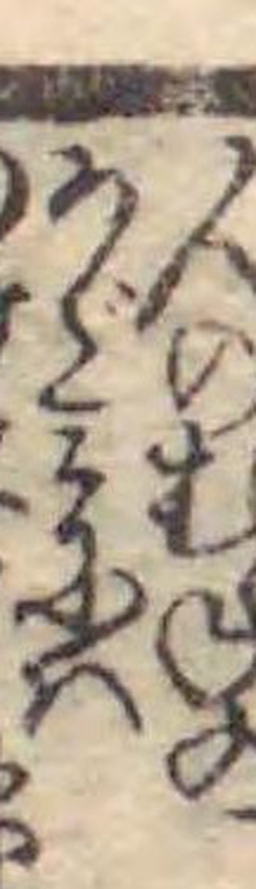かゞみには
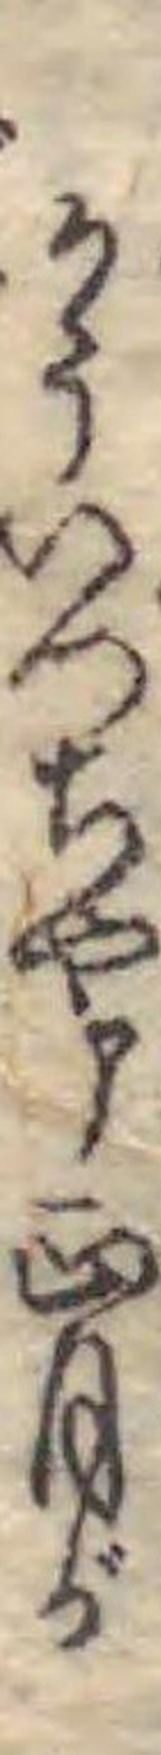かういつちやァ正月が
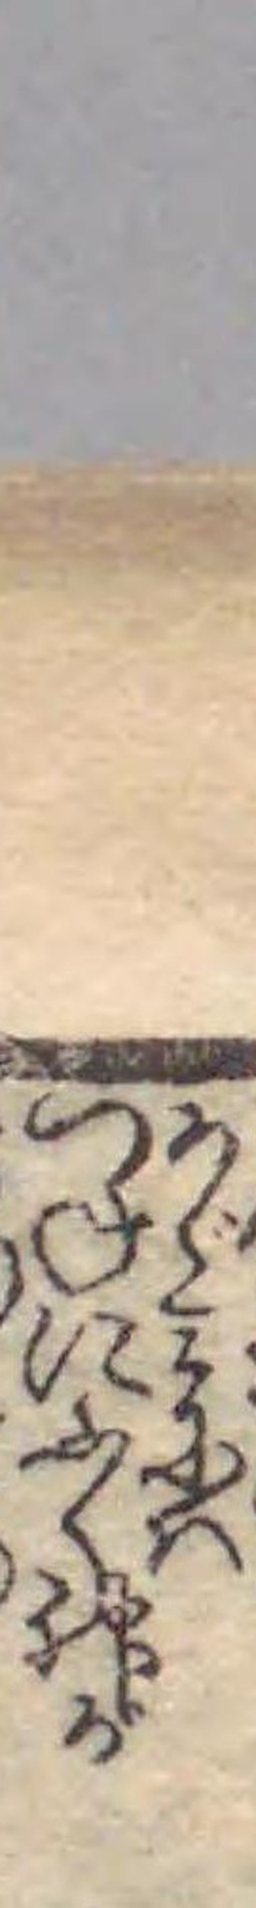つねにふく神が
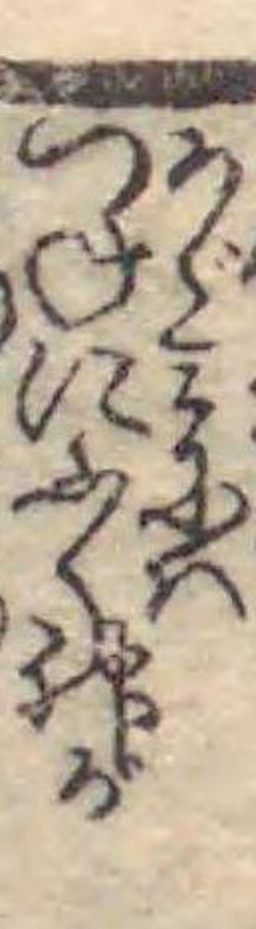つねにふく神が
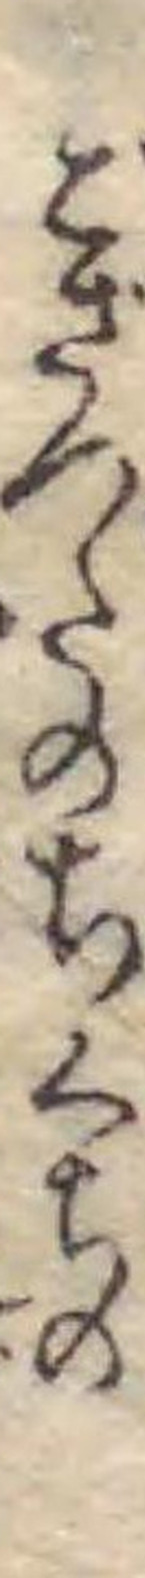ござつたのちくちの
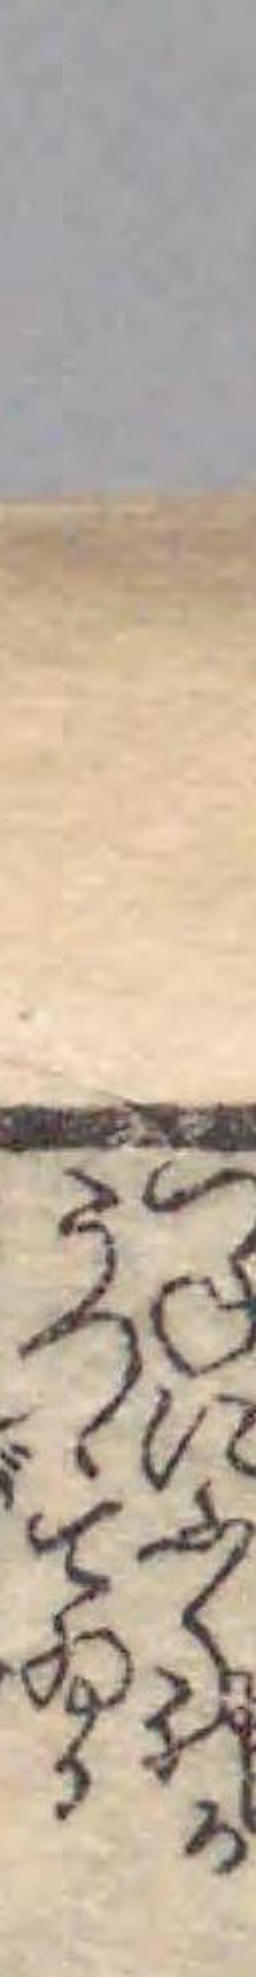うつゝてゐる
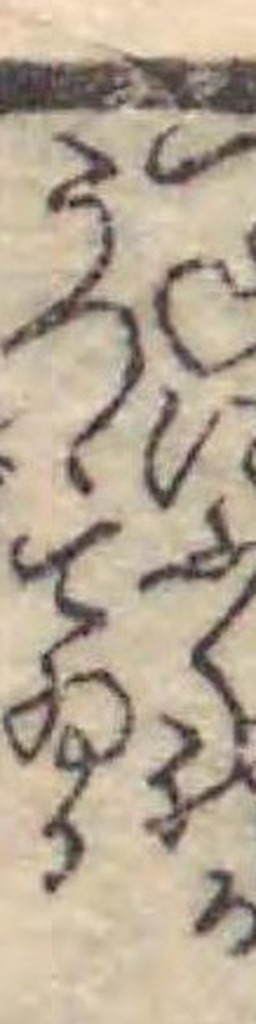うつゝてゐる
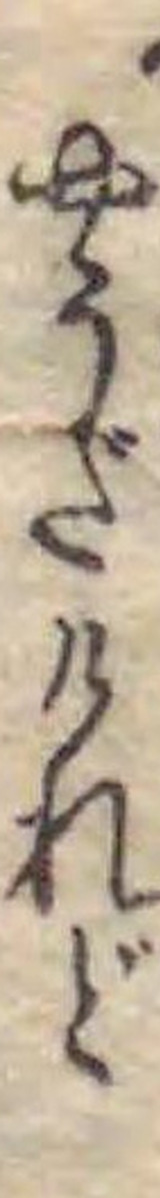やうだけれど
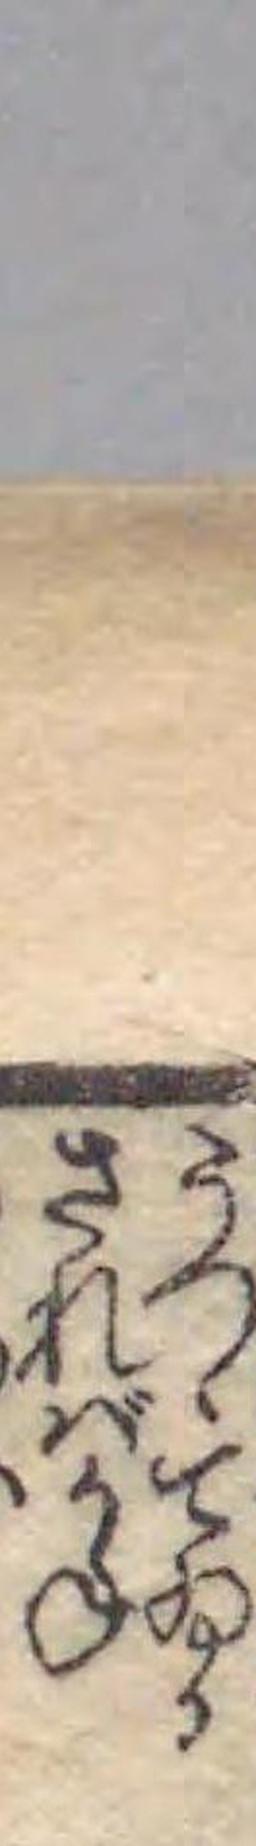さればかね
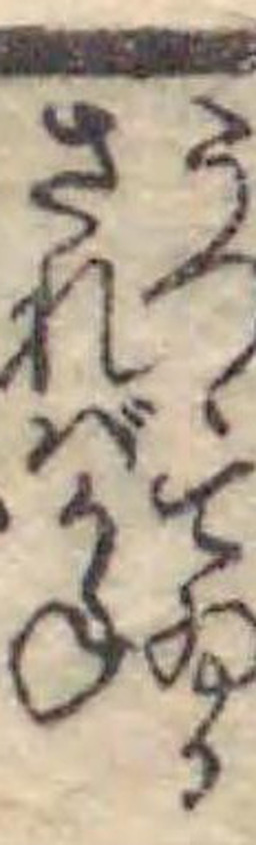さればかね
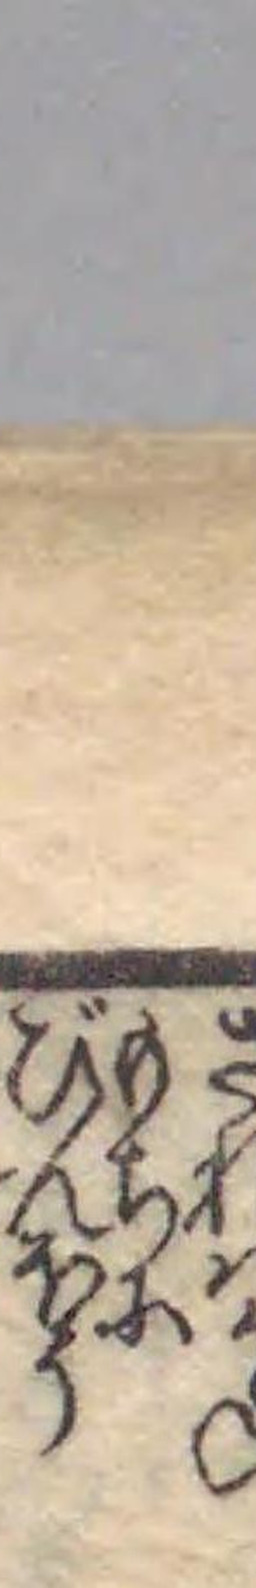もちに
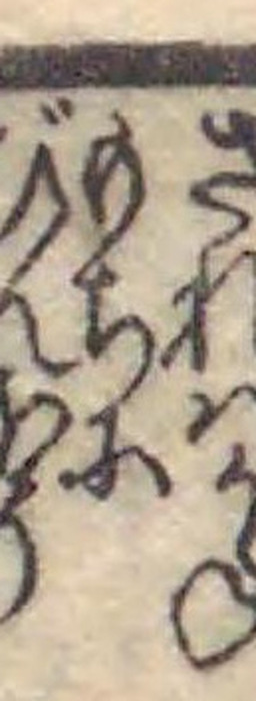もちに
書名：人心鏡写絵 : 3巻
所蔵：国立国会図書館 National Diet Library, JAPAN
